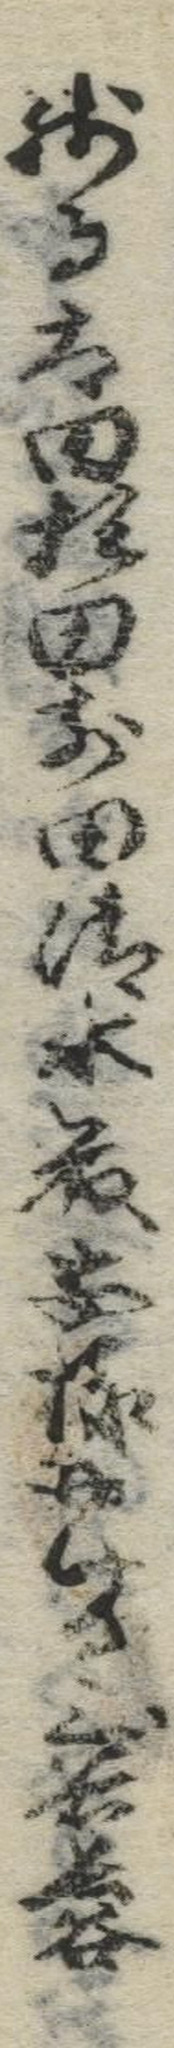残る太田杉田前田清水若安様やける三谷長谷
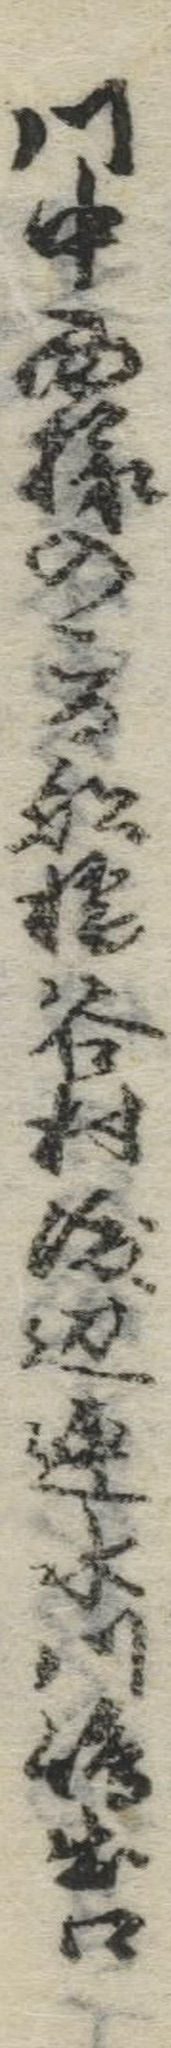川中西様のこる船橋谷村渡辺速水川嶋出口
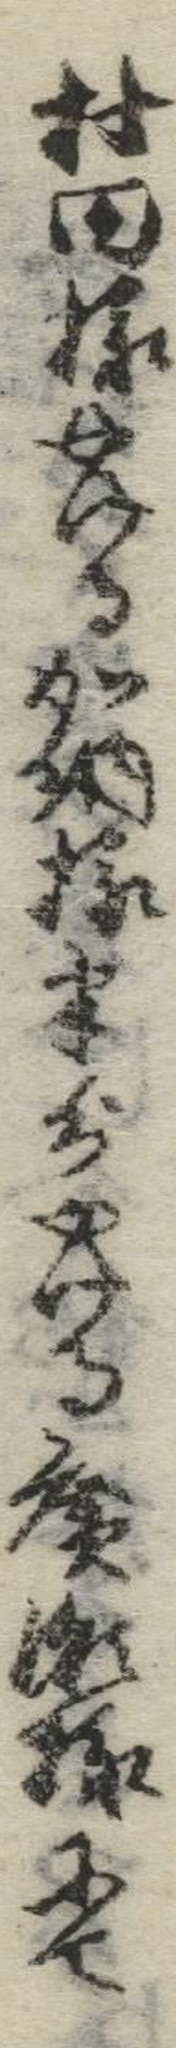村田様やける加納様半分やける広瀬様にて
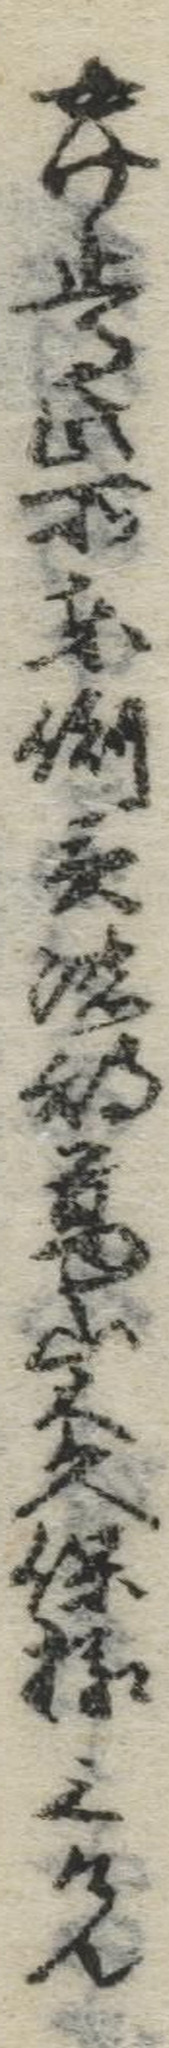やけ止る此所東側美濃部葛山大久保様三けん
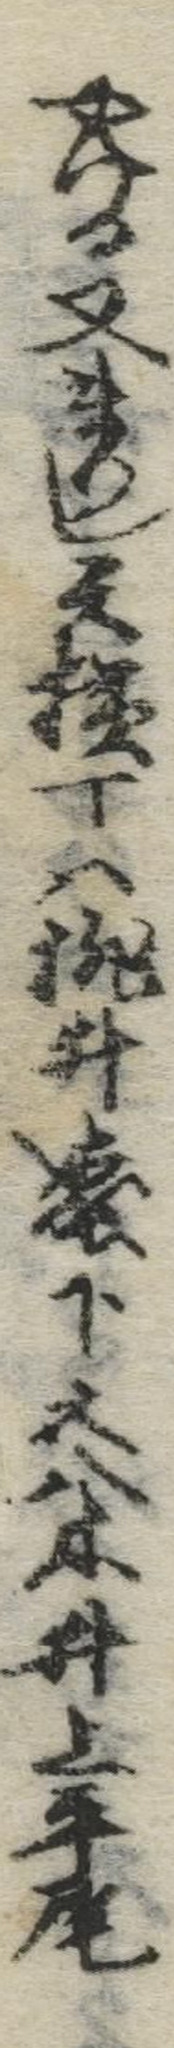やける又まりし天横丁ハ桃井森下大八木井上平尾
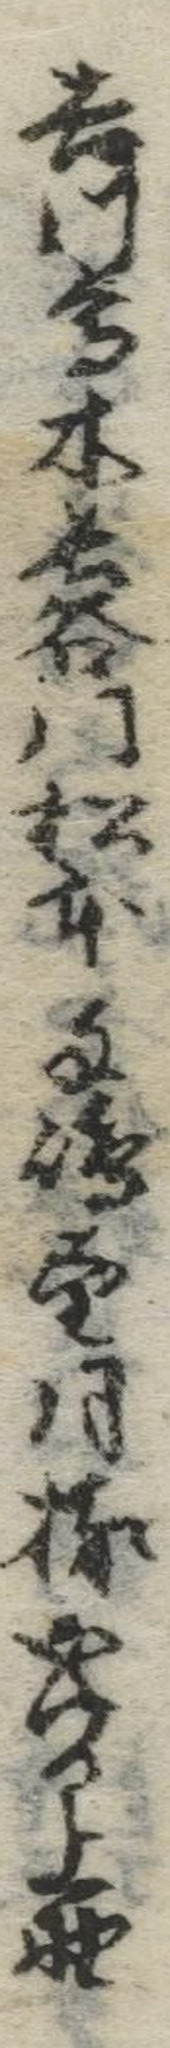吉川高木長谷川松本手嶋望月様やける上野
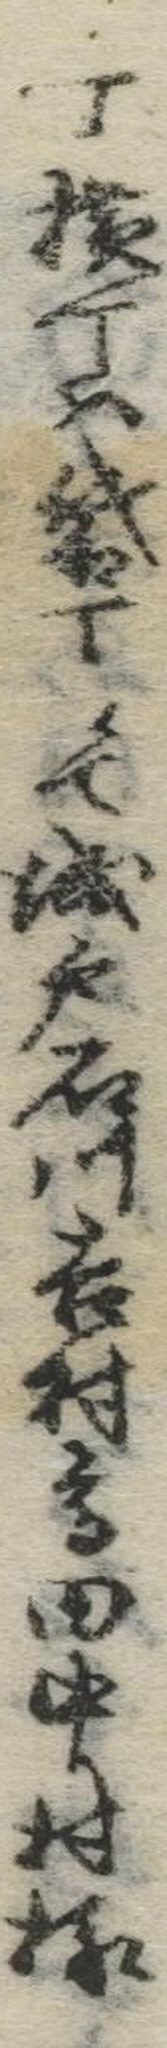丁横丁ハ袋丁にて蟻戸石川吉村高田中村様
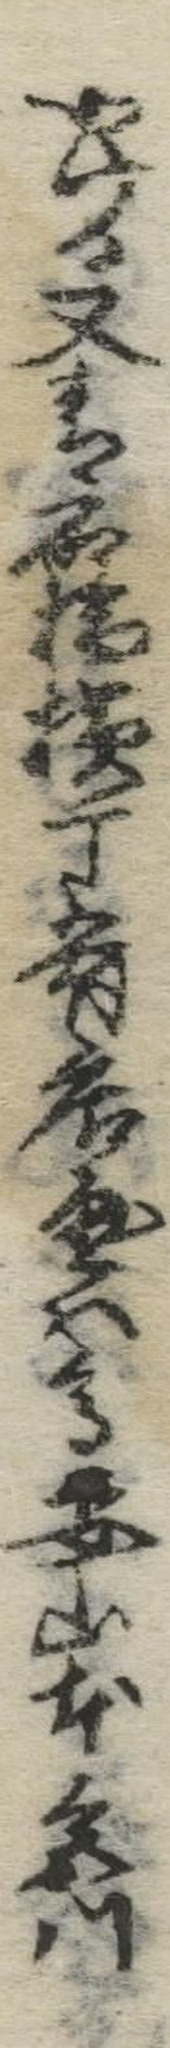やける又青石橋横丁肴店通ハ高妻山本宮川
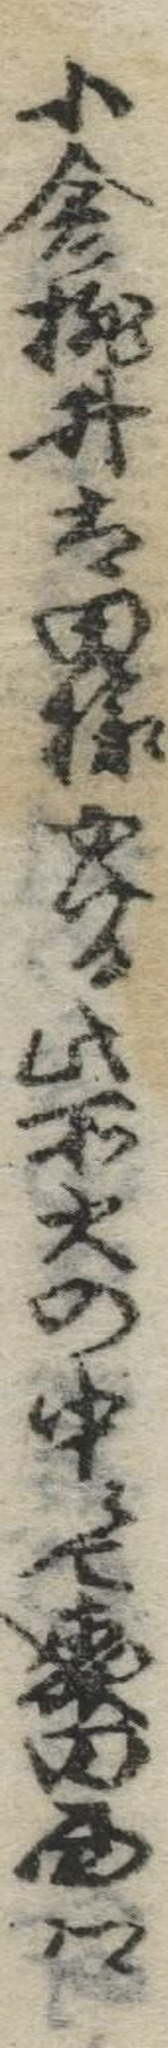小倉桃井太田様やける此所火の中にて森田西郷
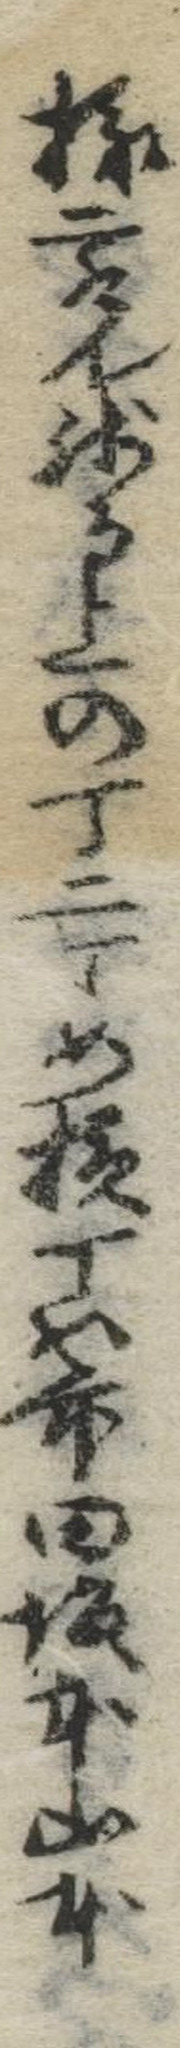様二軒残る上の丁二丁め横丁ハ市田坂本山本
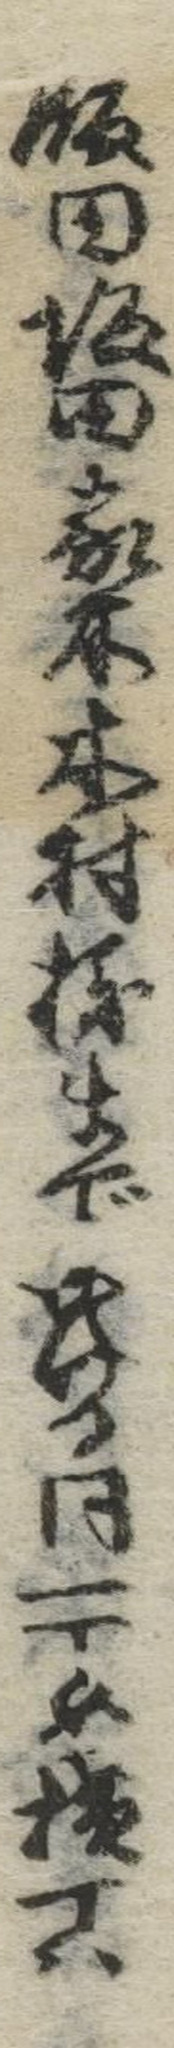飯田坂田家木木村様までやける同一丁め横丁ハ
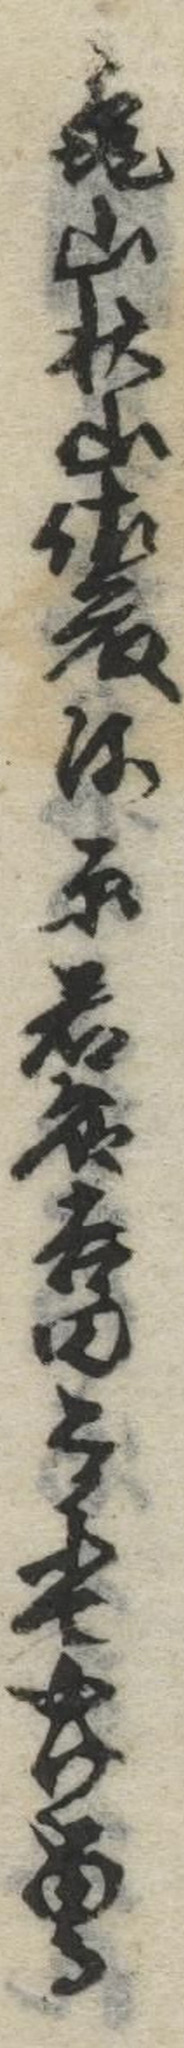亀山秋山佐藤伊原若名吉田こゝにてやけ留る

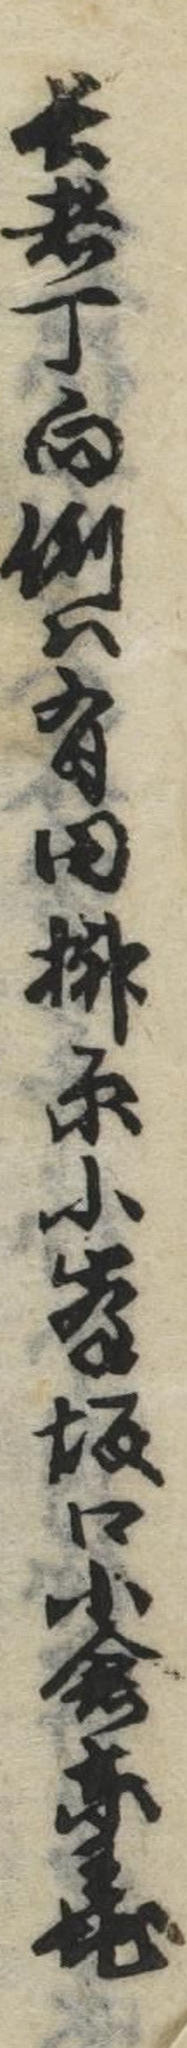長者丁向側ハ有田榊原小嶋坂口小倉東王地
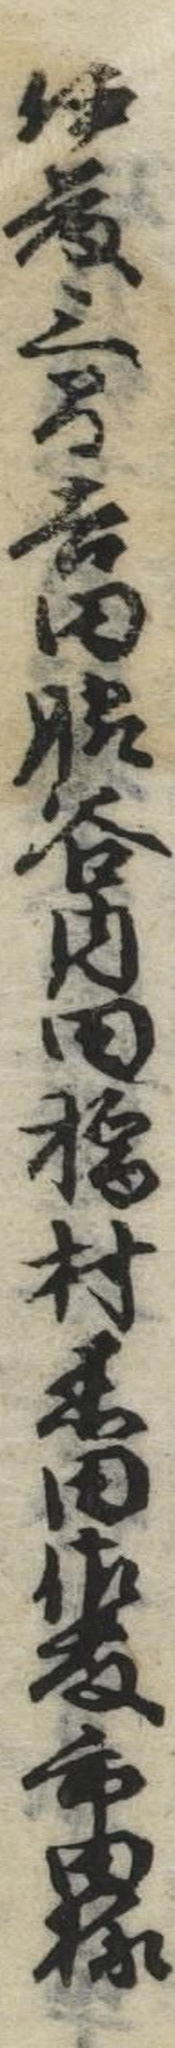伊藤三間吉田脇谷内田稲村黒田佐藤市田様
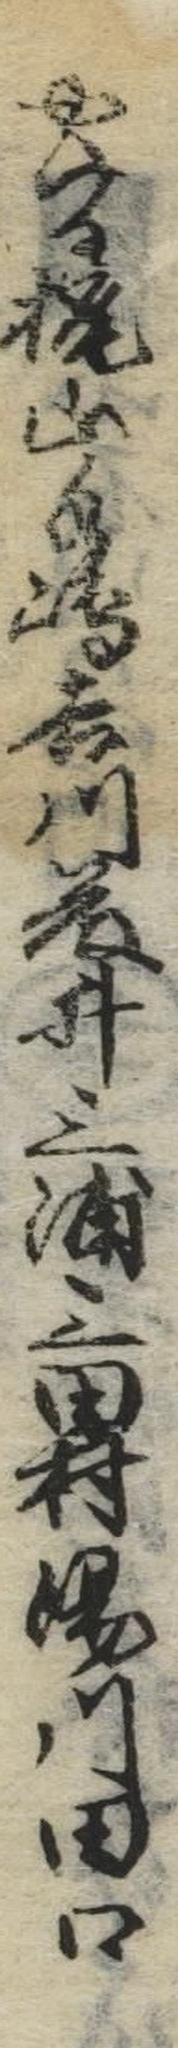やける梶山手嶋吉川藤井三浦三田村湯川田口
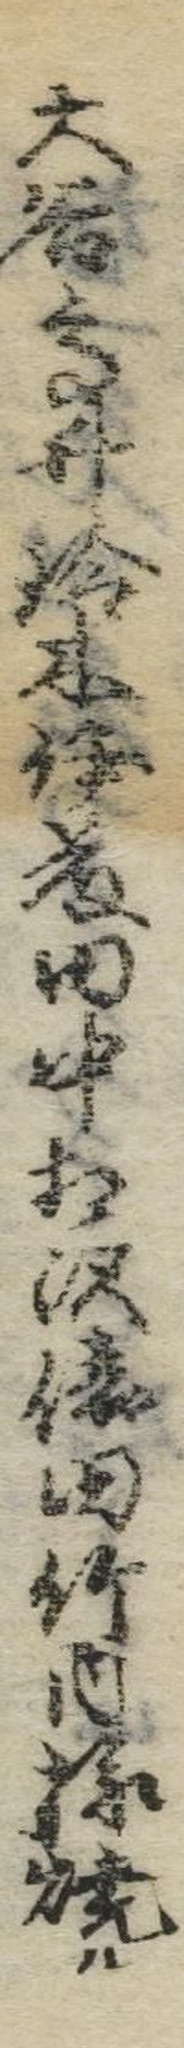大谷高井鈴木伊藤田中相沢億田竹内様焼ㇽ
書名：安政二卯十月二日夜四ツ時過　御府内御屋敷方市中共　地震類焼場所明細書之寫　并街道筋近郷聞書
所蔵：東京大学地震研究所図書室 Earthquake Research Institute Library, The University of Tokyo, JAPAN
